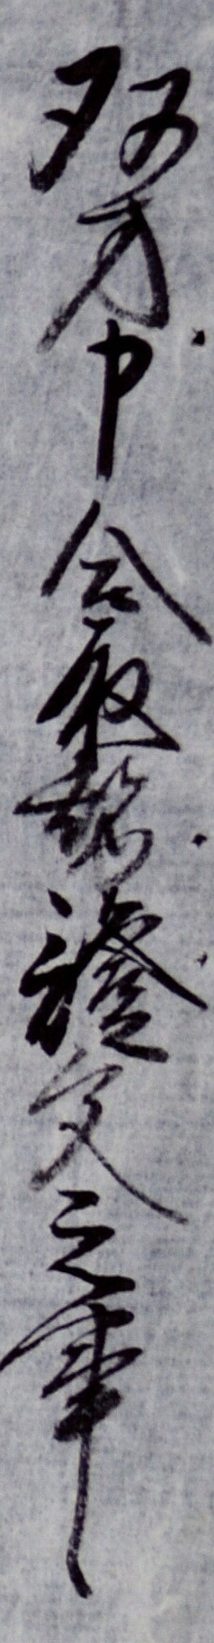双方申合取替証文之事
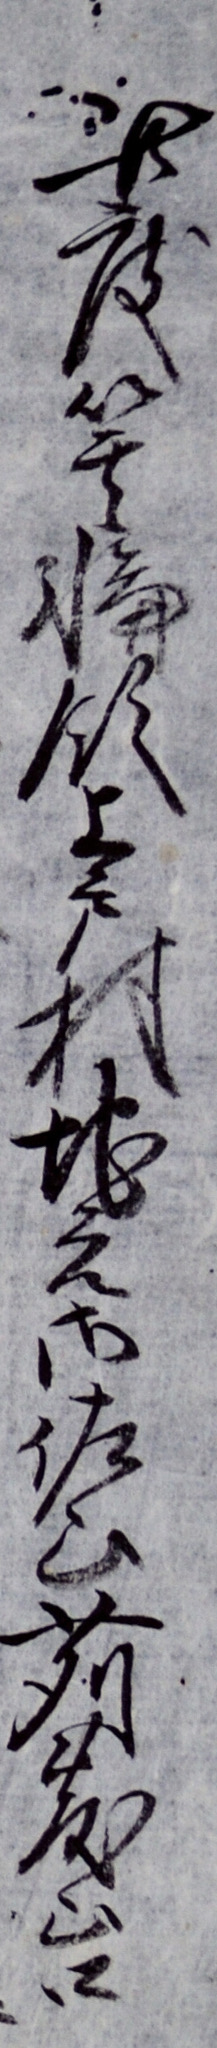此度箕輪領上戸村地元御佐山苅敷山口
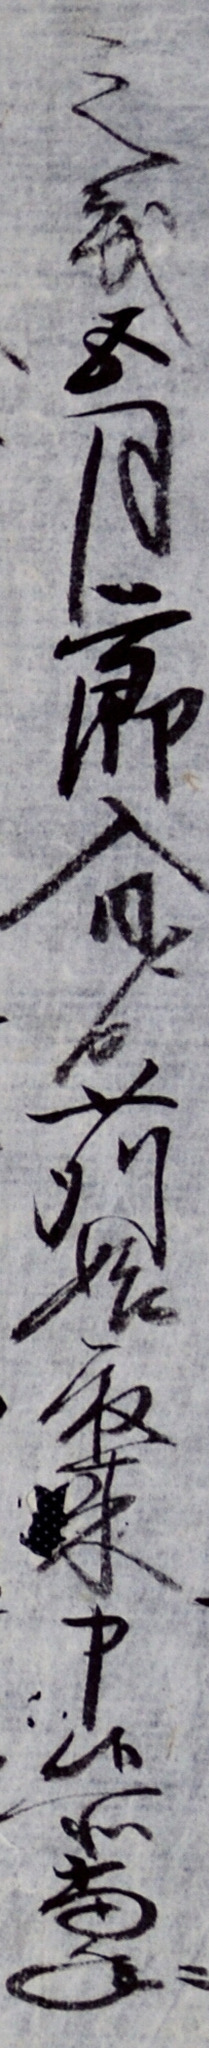之義五月節入日ゟ苅始取来申候所当年ニ
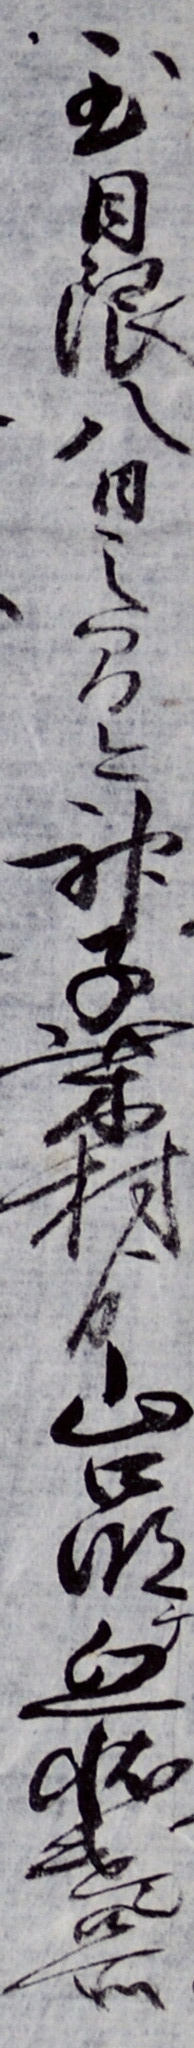至日限八月之間と神子柴村ゟ山口明ケ廻状遣シ候所
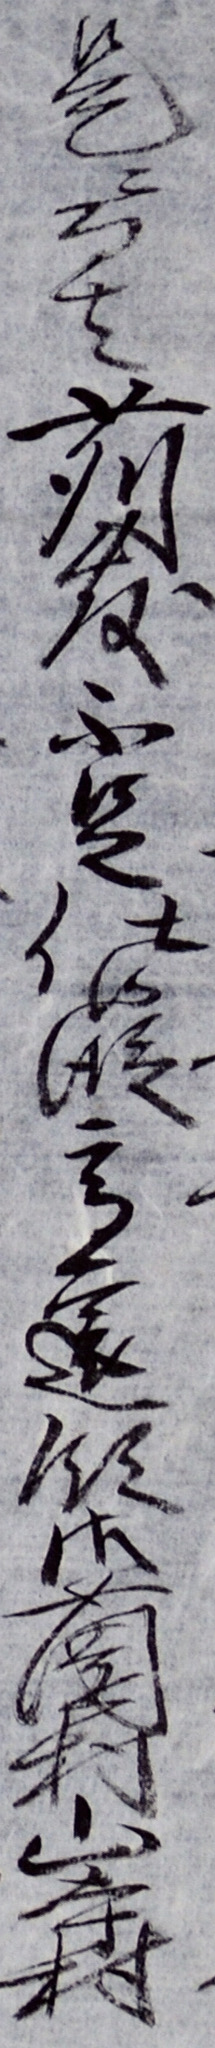是ニ而者苅敷不足仕候段高遠領御薗村山寺村
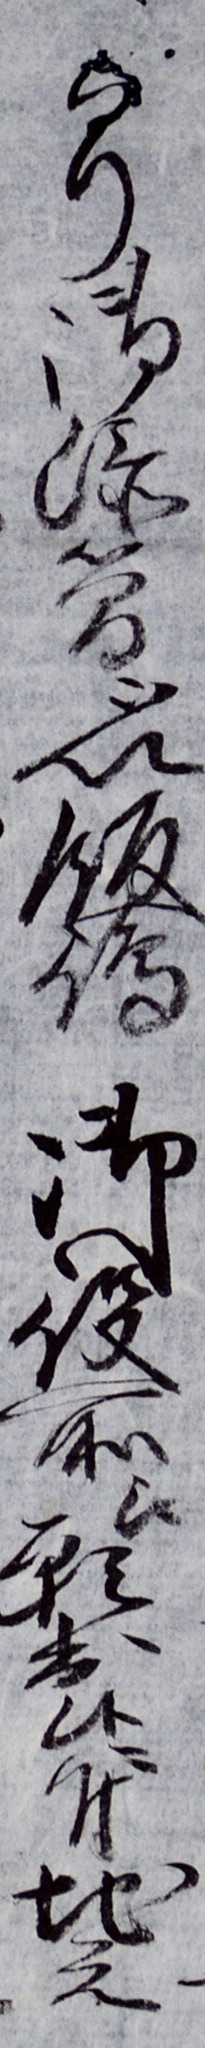より御添簡ヲ以飯嶋御役所江願出候ニ付地元
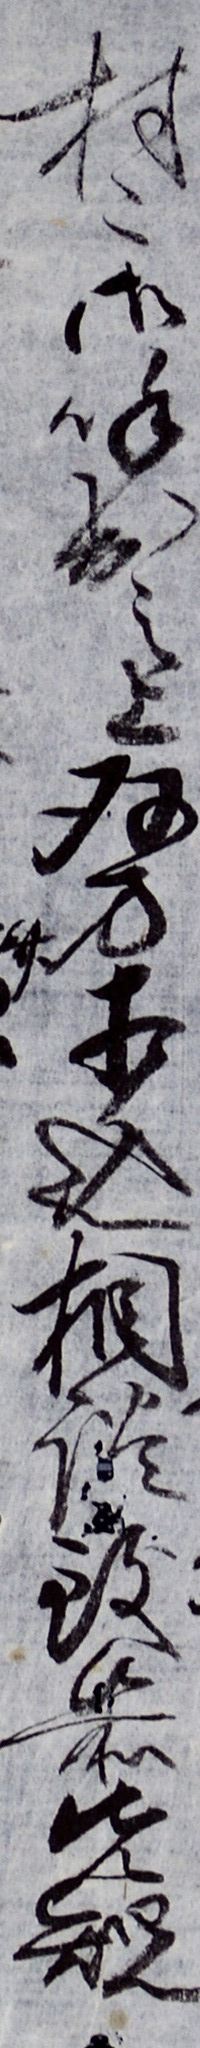村々御呼出之上双方打込相談致候所先規
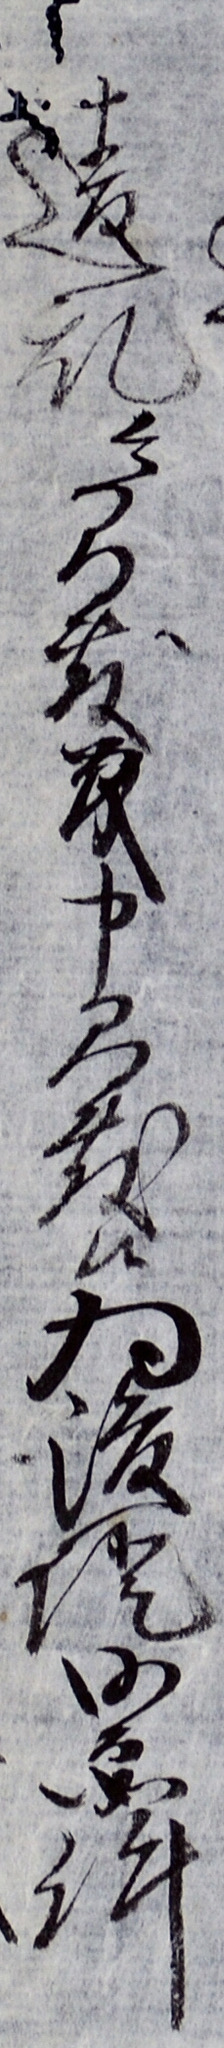違乱ケ間敷義申間敷候為後証仍而如件
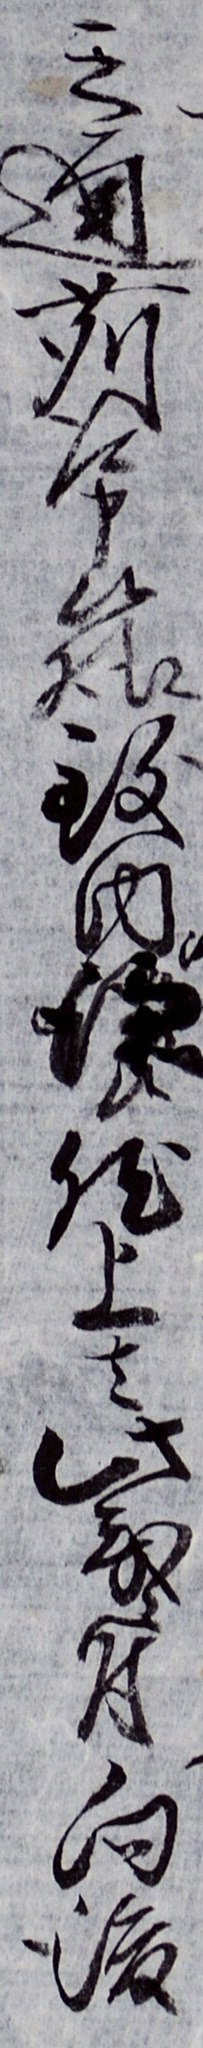之通苅取申候様致内済候然上者此義ニ付向後
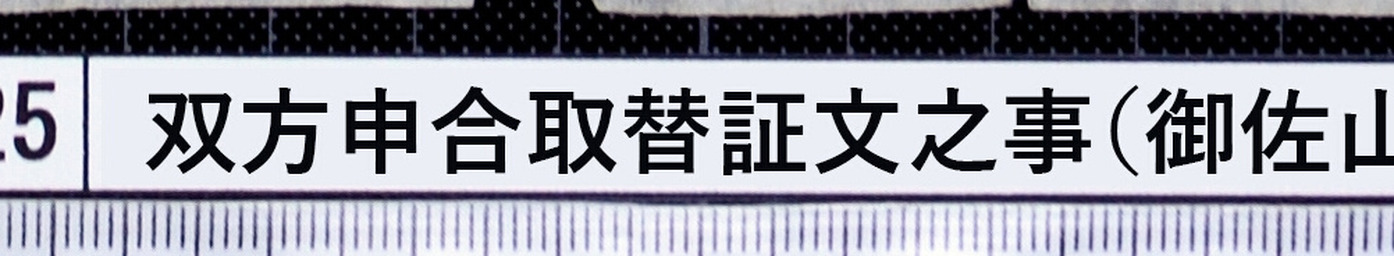双方申合取替証文之事
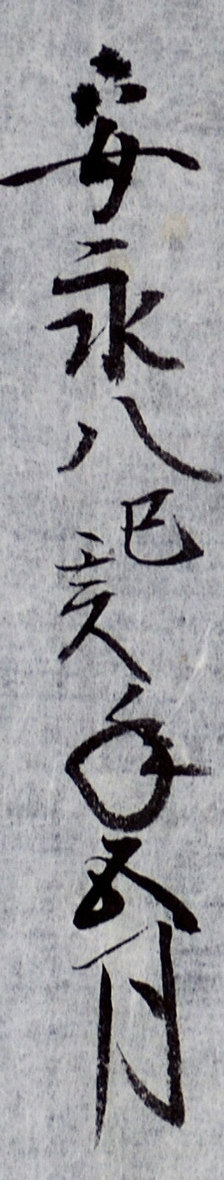安永八己亥年五月
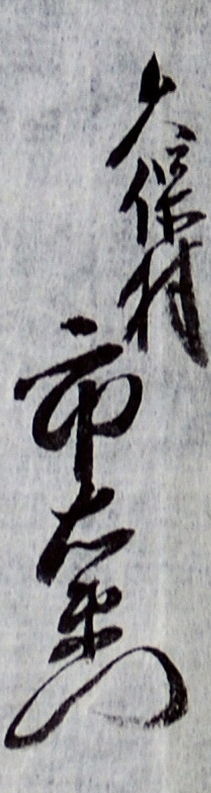久保村市右衛門
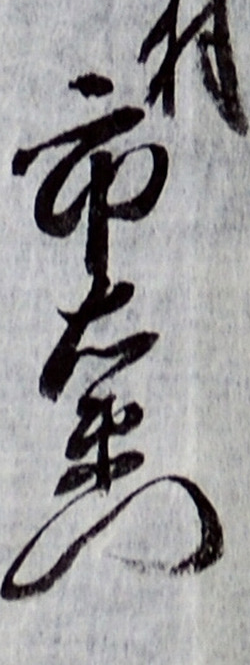八右衛門
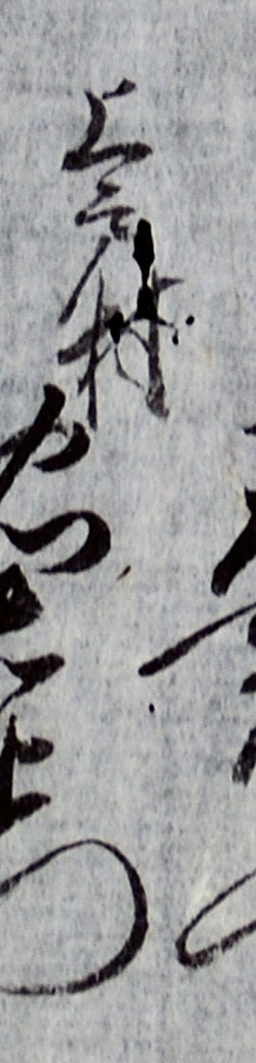上戸村忠右衛門
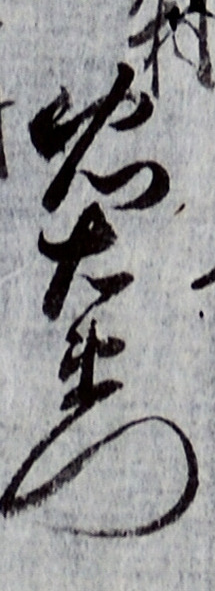八右衛門
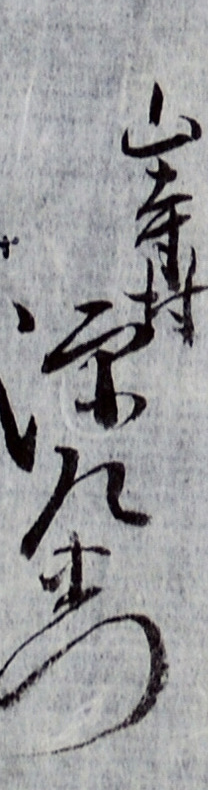山寺村源左衛門
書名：双方申合取替証文之事
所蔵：伊那市立高遠町図書館・合同会社AMANE
